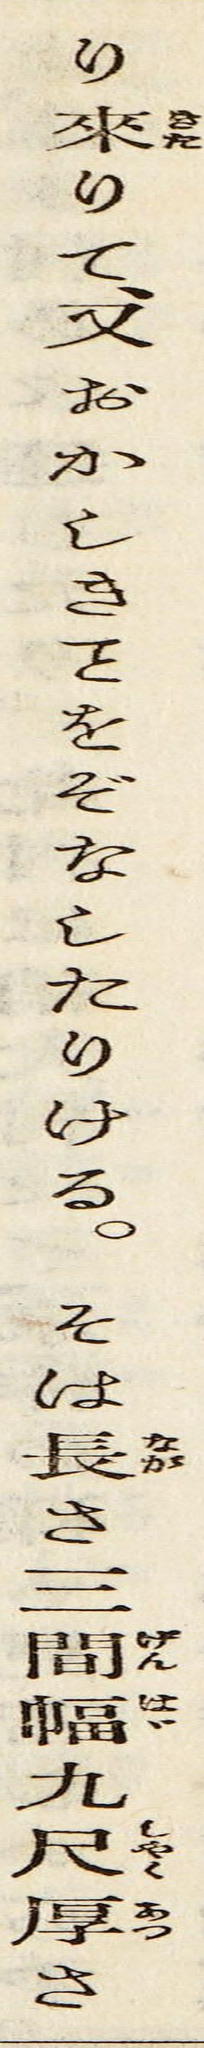り来りて、又おかしきことをぞなしたりける。そは長さ三間幅九尺厚さ
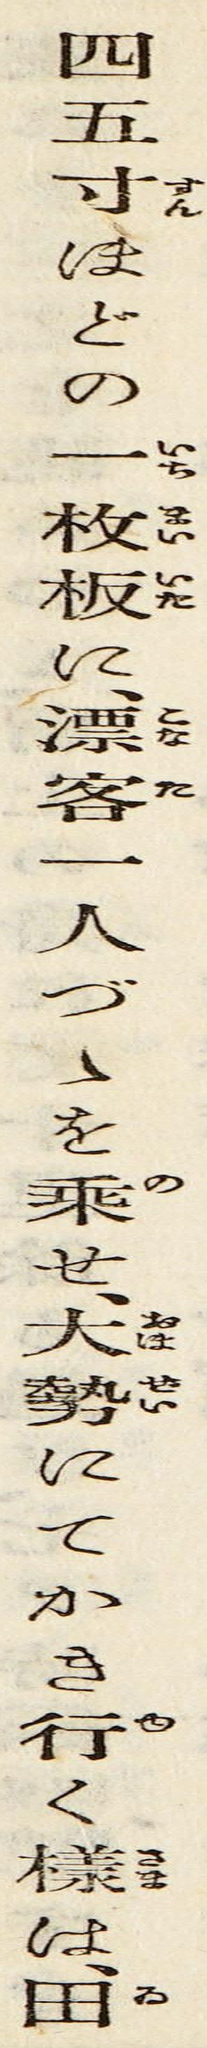四五寸ほどの一枚板に、漂客一人づゝを乗せ、大勢にてかき行く様は、田
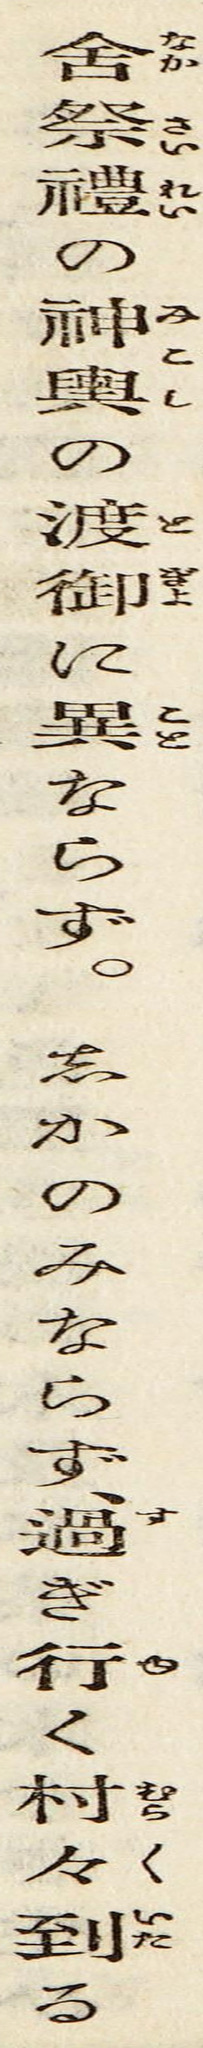舎祭礼の神輿の渡御に異ならず。しかのみならず、過ぎ行く村々到る
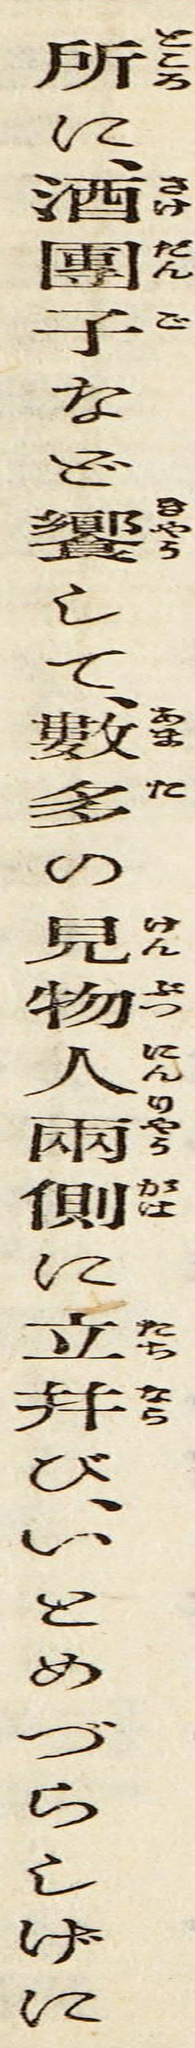所に、酒団子など饗して、数多の見物人両側に立并び、いとめづらしげに

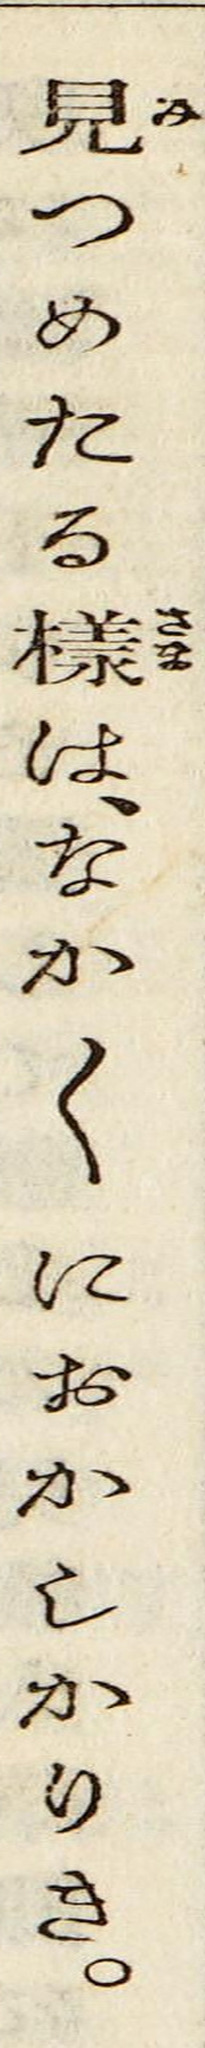見つめたる様は、なか〳〵におかしかりき。
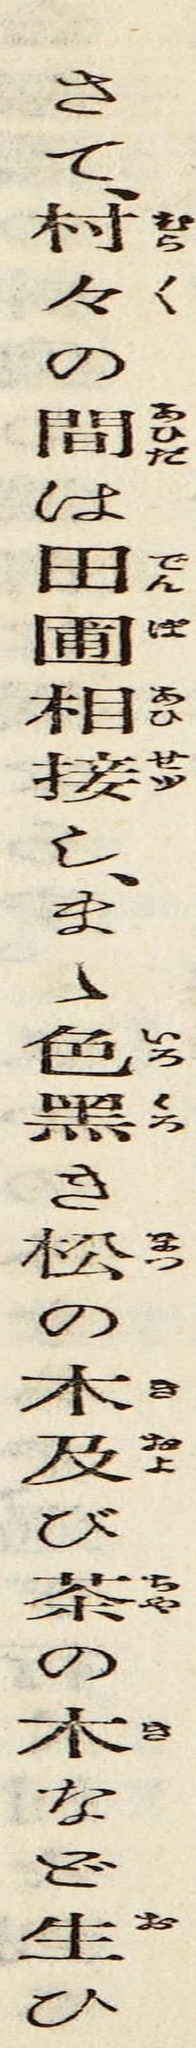さて、村々の間は田圃相接し、まゝ色黒き松の木及び茶の木など生ひ
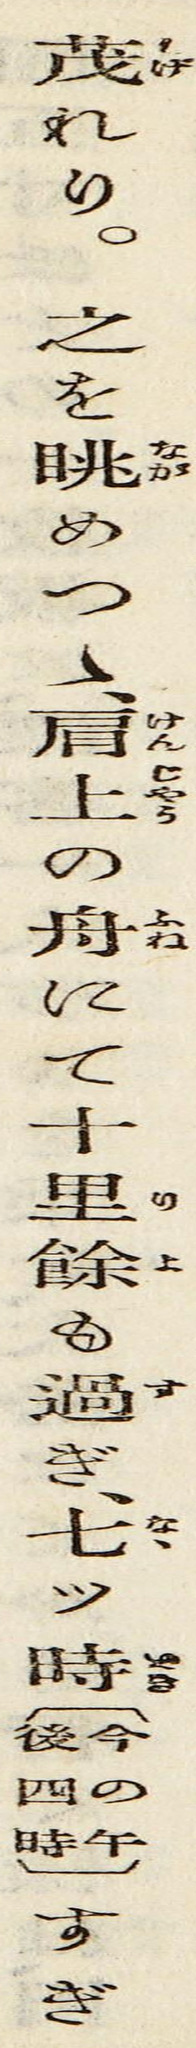茂れり。之を眺めつゝ、肩上の舟にて十里余も過ぎ、七ツ時[今の午後四時]すぎ
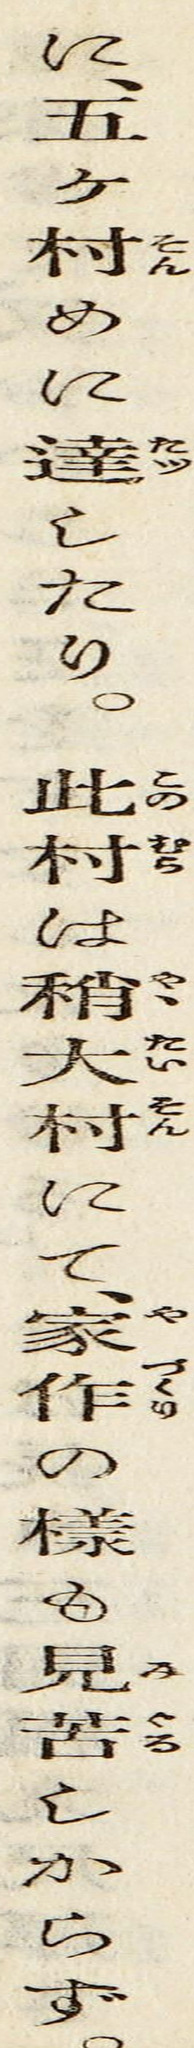に、五ケ村めに達したり。此村は稍大村にて、家作の様も見苦しからず。
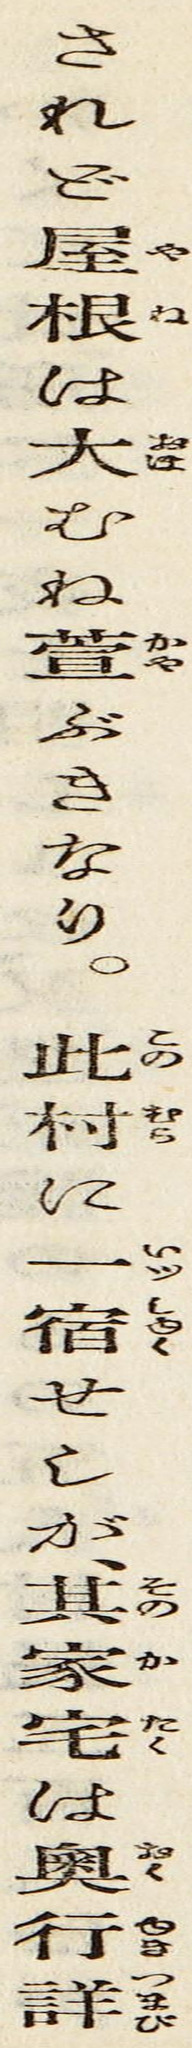されど屋根は大むね萱ぶきなり。此村に一宿せしが、其家宅は奥行詳
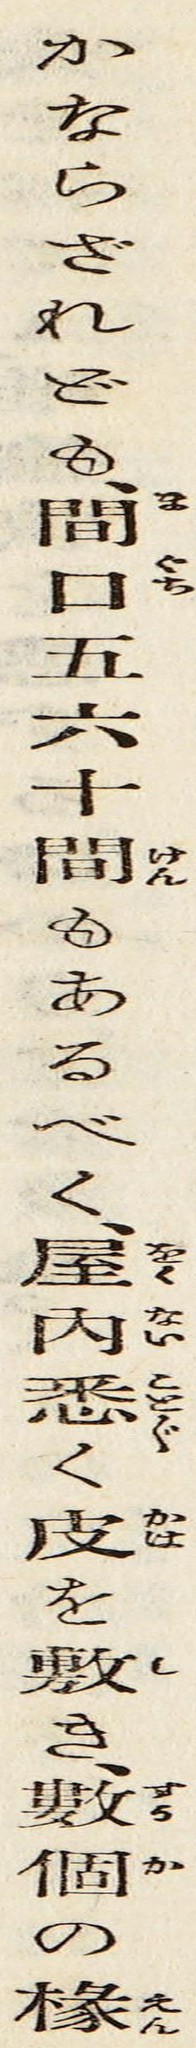かならざれども、間口五六十間もあるべく、屋内悉く皮を敷き、数個の椽
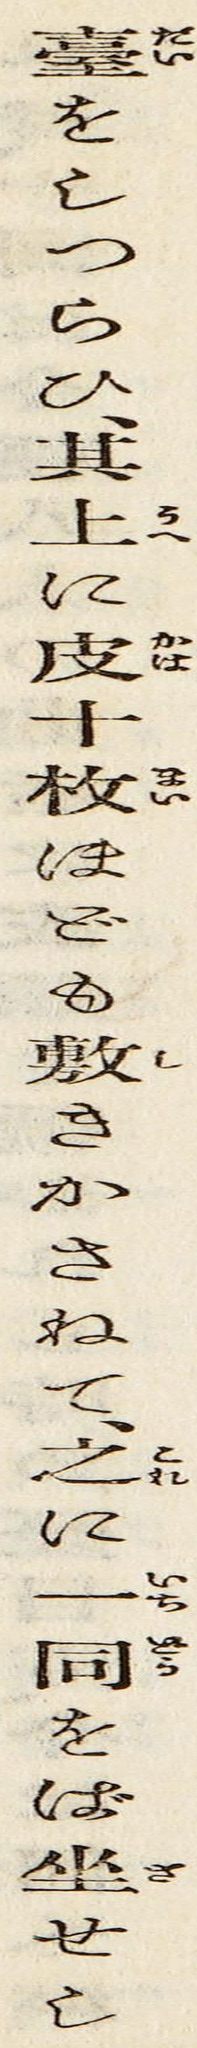台をしつらひ、其上に皮十枚ほども敷きかさねて、之に一同をば坐せし
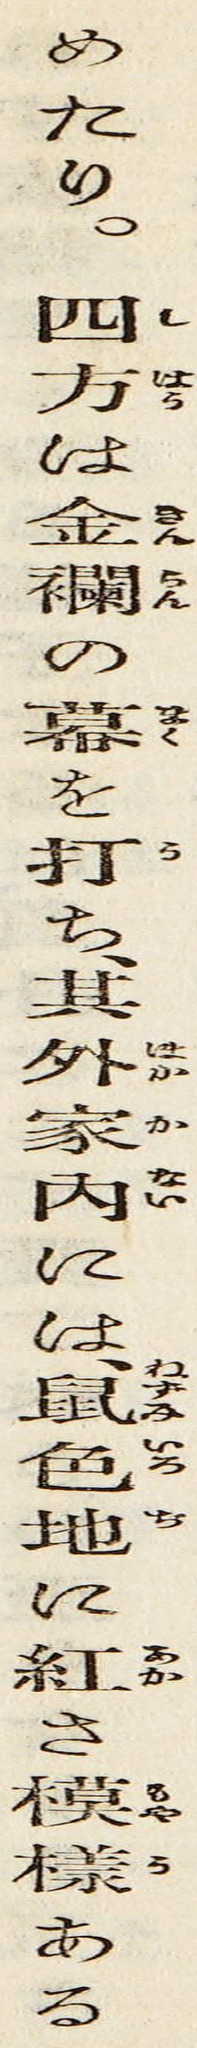めたり。四方は金襴の幕を打ち、其外家内には、鼠色地に紅さ模様ある
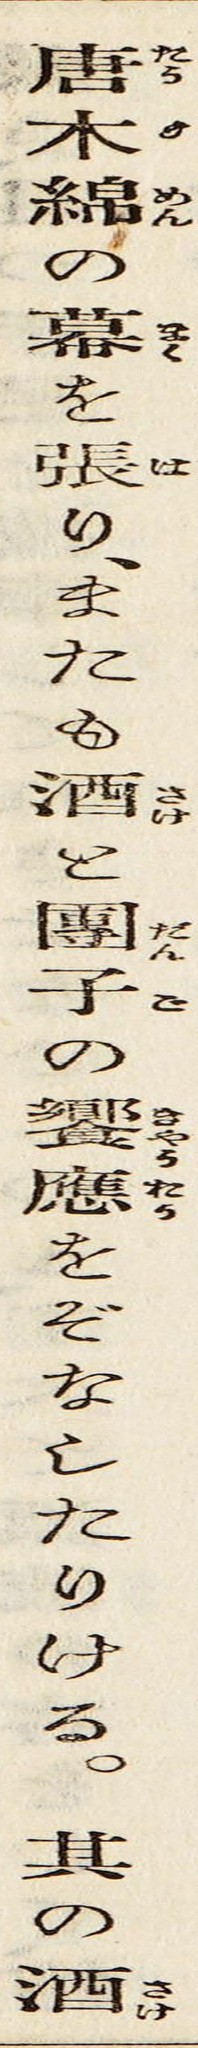唐木綿の幕を張り、またも酒と団子の饗応をぞなしたりける。其の酒
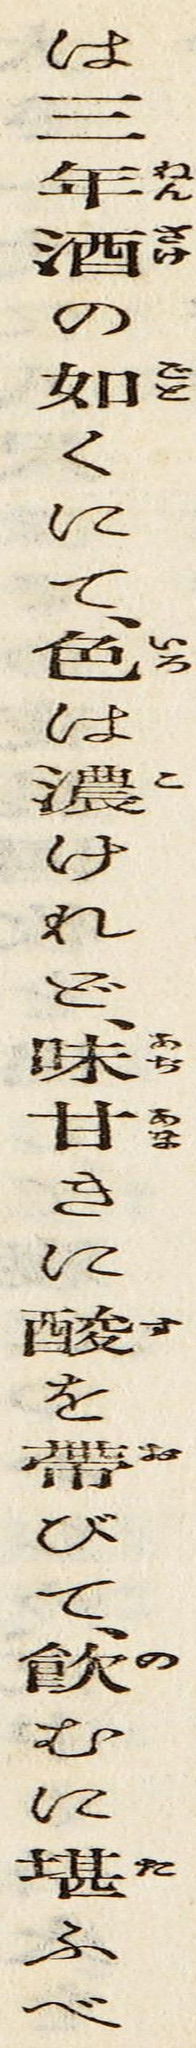は三年酒の如くにて、色は濃けれど、味甘きに酸を帯びて、飲むに堪ふべ
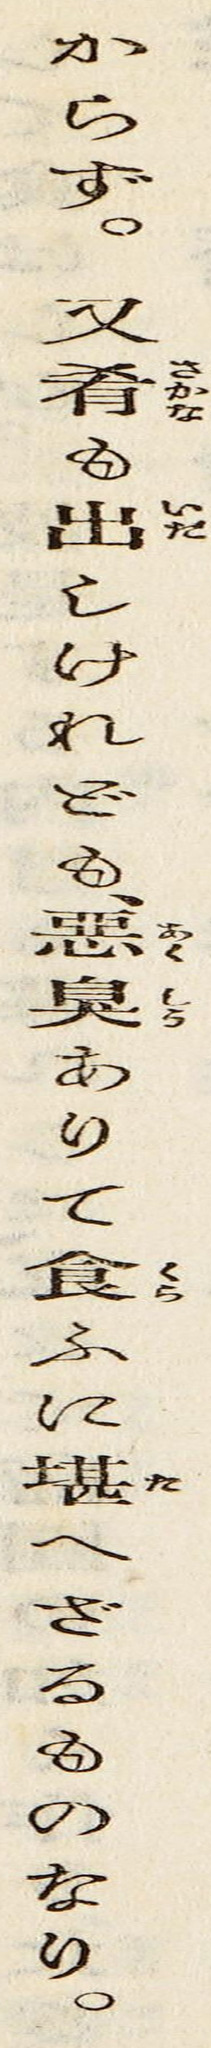からず。又肴も出しけれども、悪臭ありて食ふに堪へざるものなり。
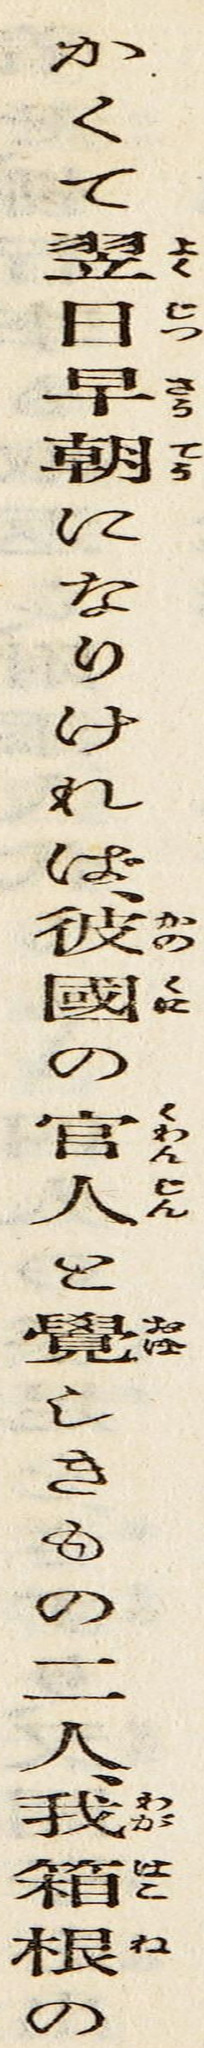かくて翌日早朝になりければ、彼国の官人と覚しきもの二人、我箱根の
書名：日本漂流譚
